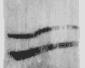二
